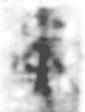南
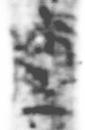陵
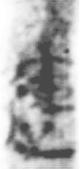連
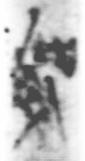○（敖）
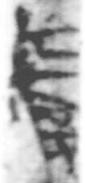馭（御）
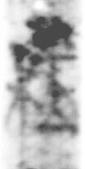椯
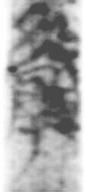轂
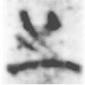之
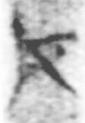反
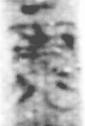彔（綠）
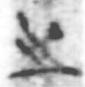之
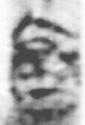裏
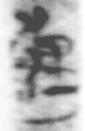○（貍）
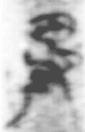鞞
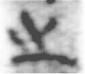之
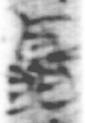聶（攝）
